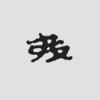弗
